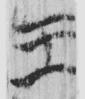王
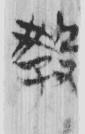教
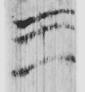王
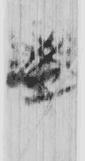學
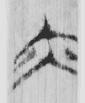亦
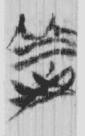義
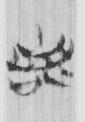若
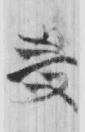寺
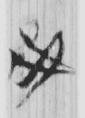我
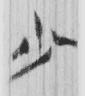少
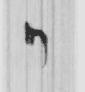人
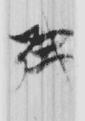隹
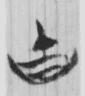由
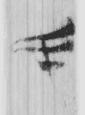民
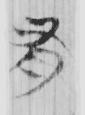有
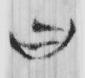曰
